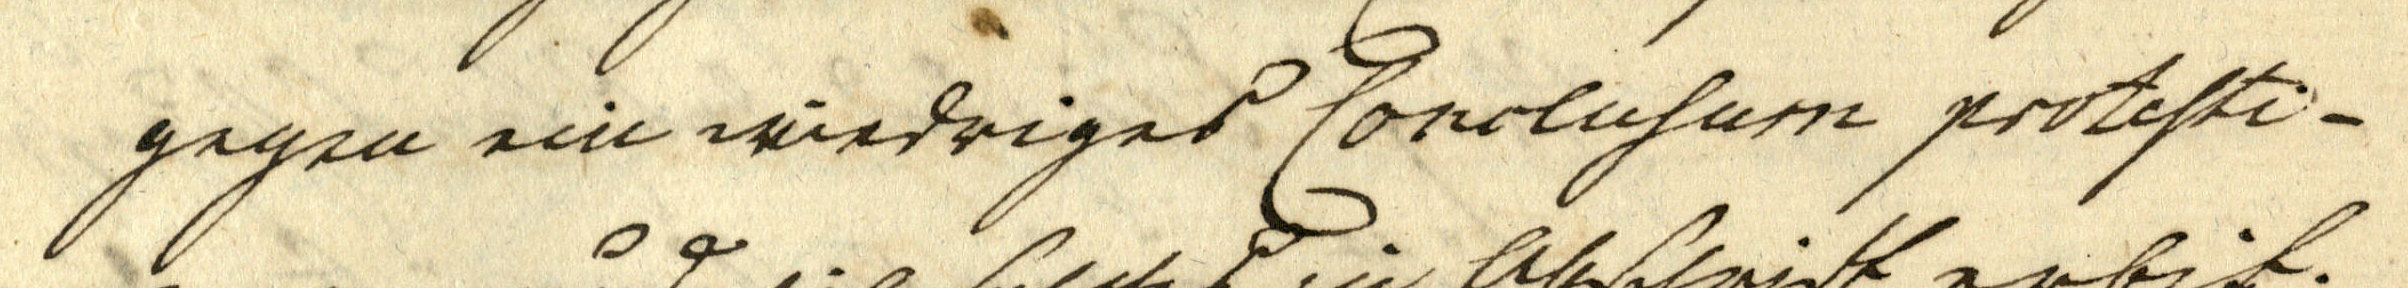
gegen ein wiedriges Conclusum protesti¬
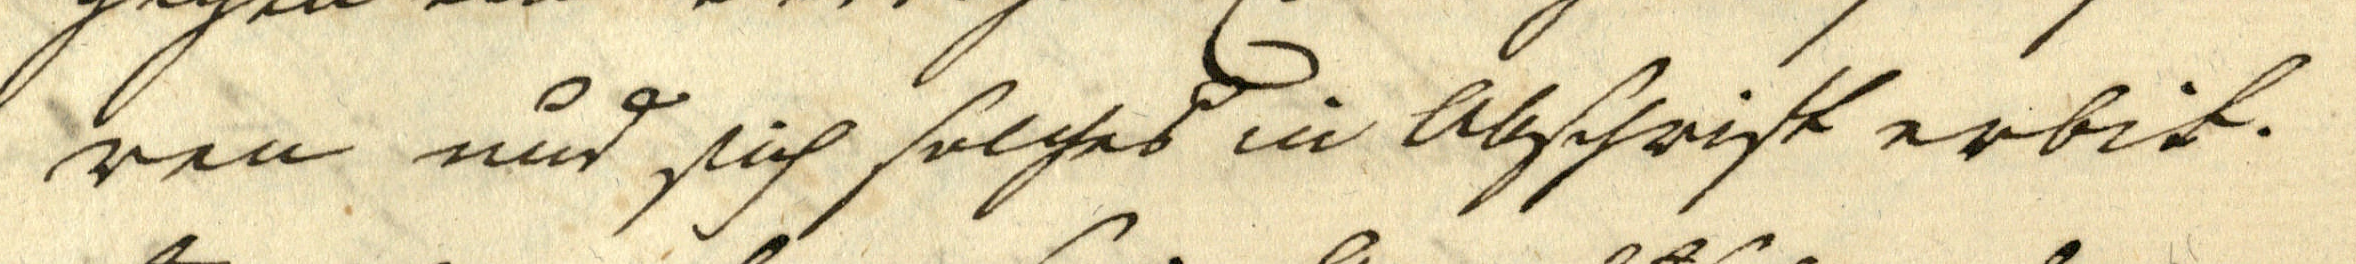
ren und sich solches in Abschrift erbit¬
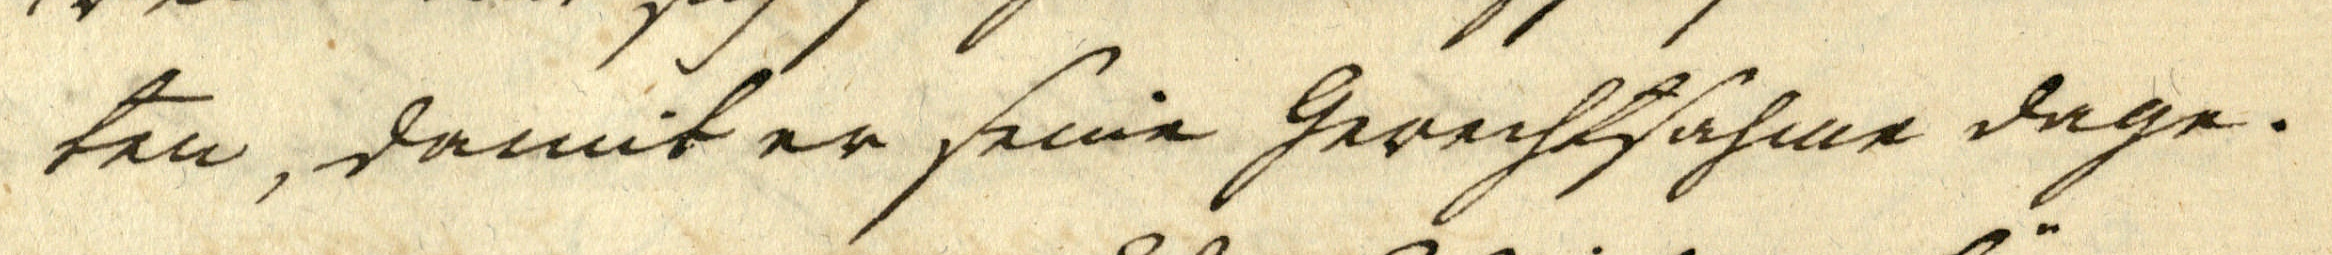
ten, damit er seine Gerechtsahme dage¬
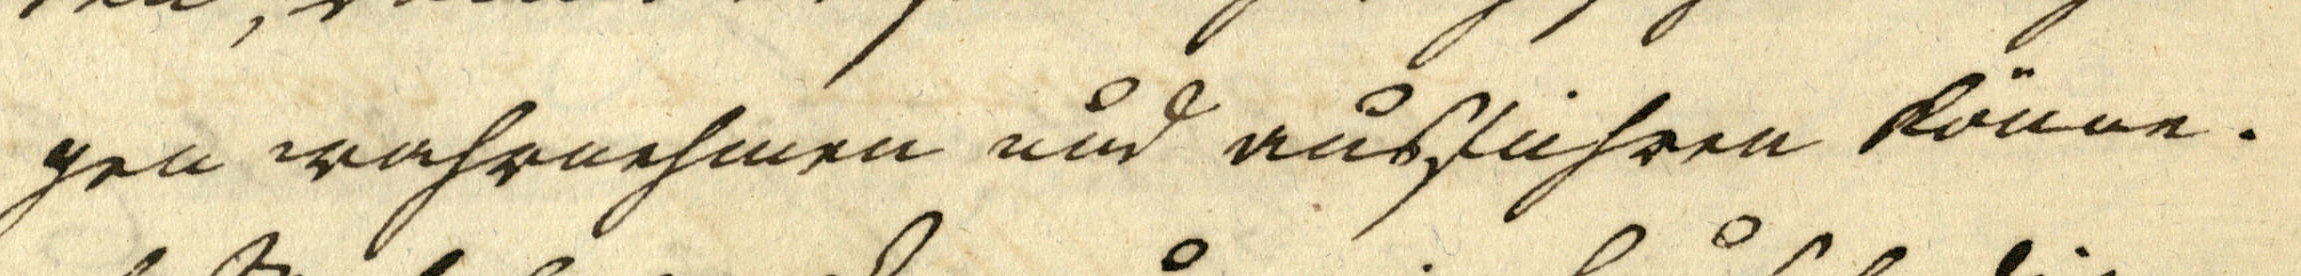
gen wahrnehmen und ausführen könne.
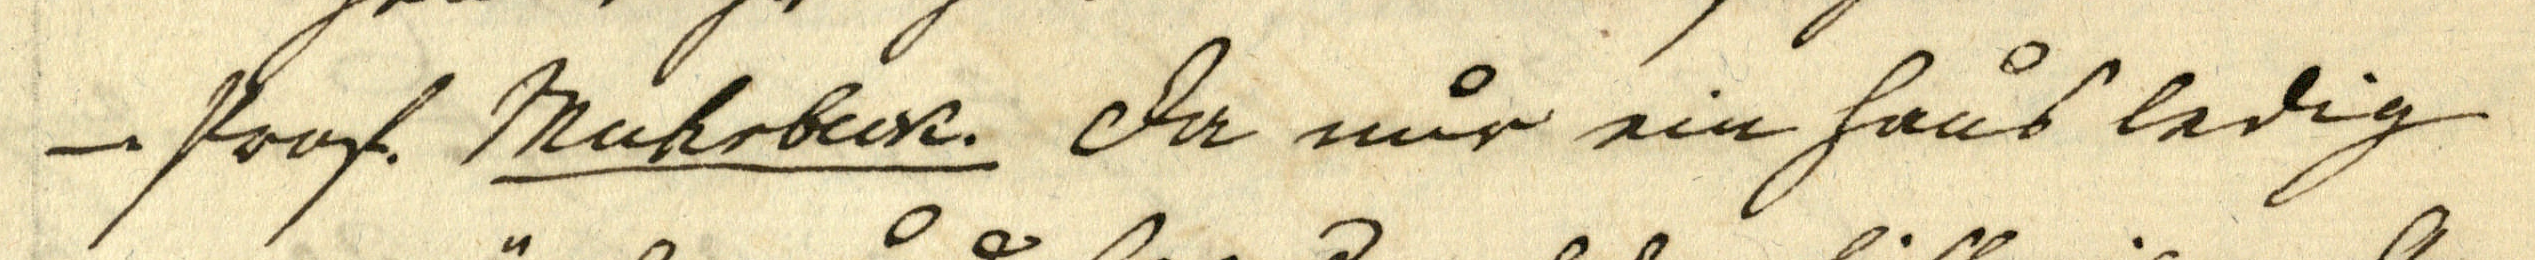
Prof. Muhrbeck. Da nur ein Haus ledig
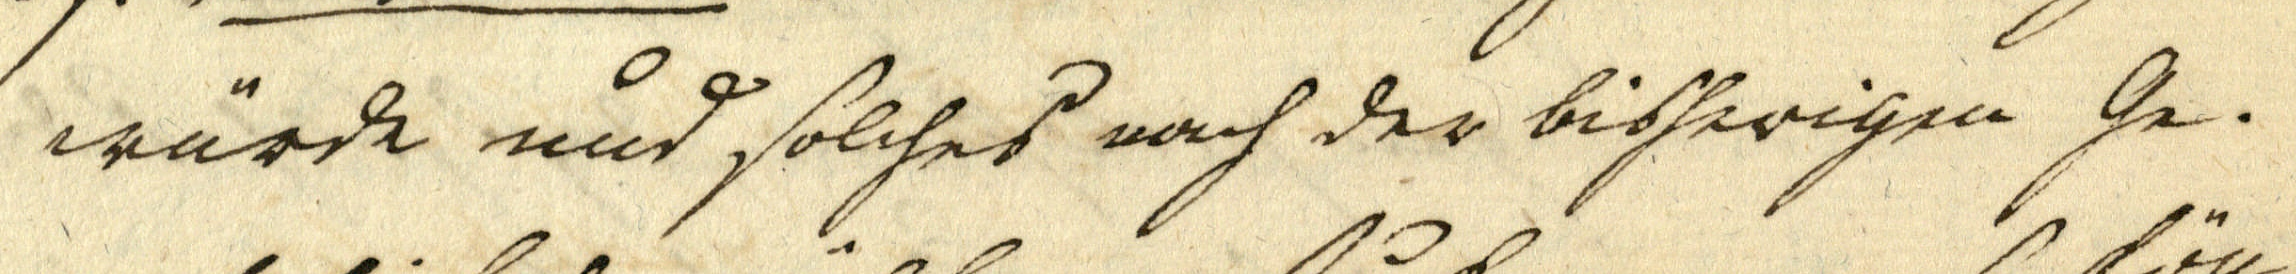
würde und solches nach der bisherigen Ge¬
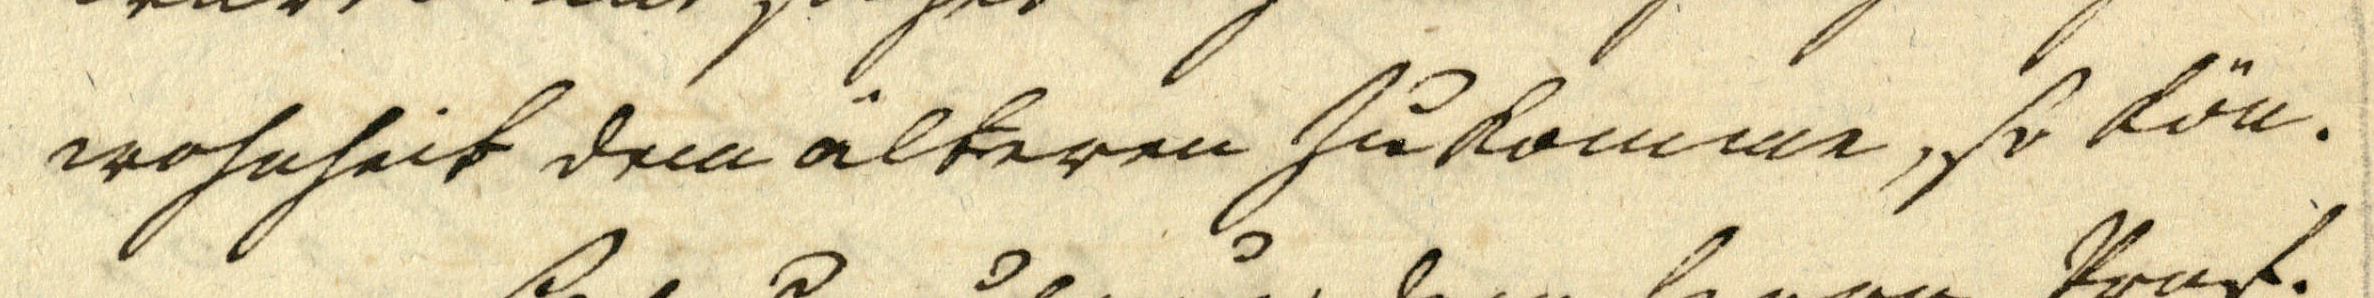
wohheit dem älteren zukomme, so kön¬
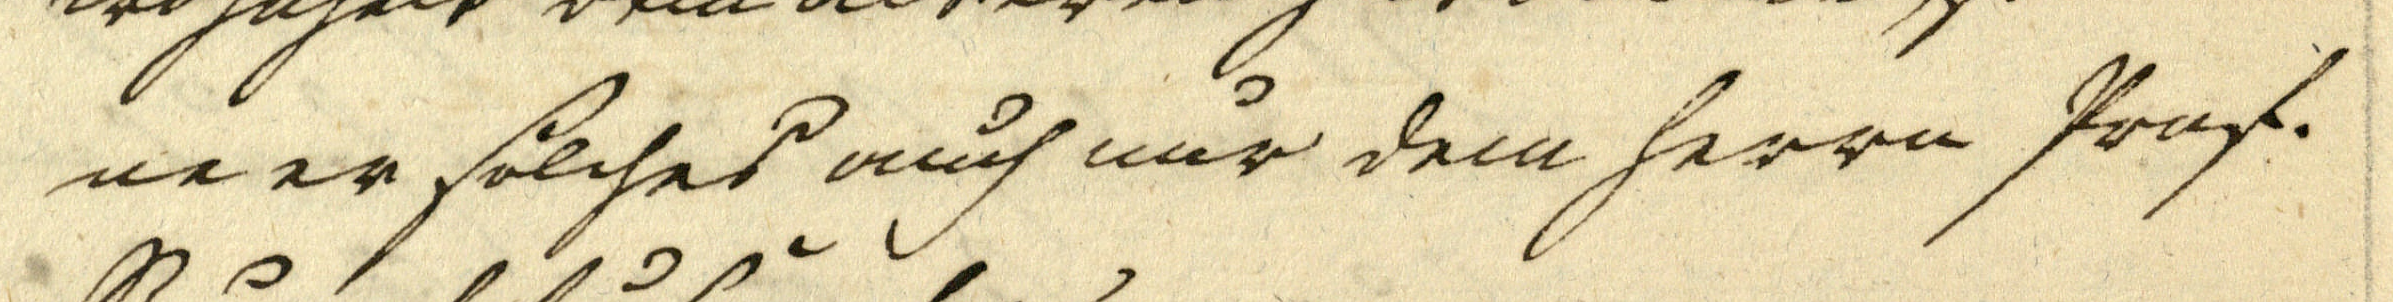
ne er solches auch nur dem Herrn Prof.
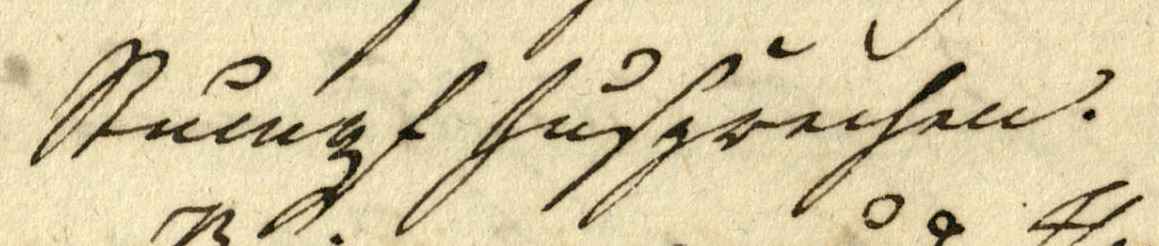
Stumpf zusprechen.
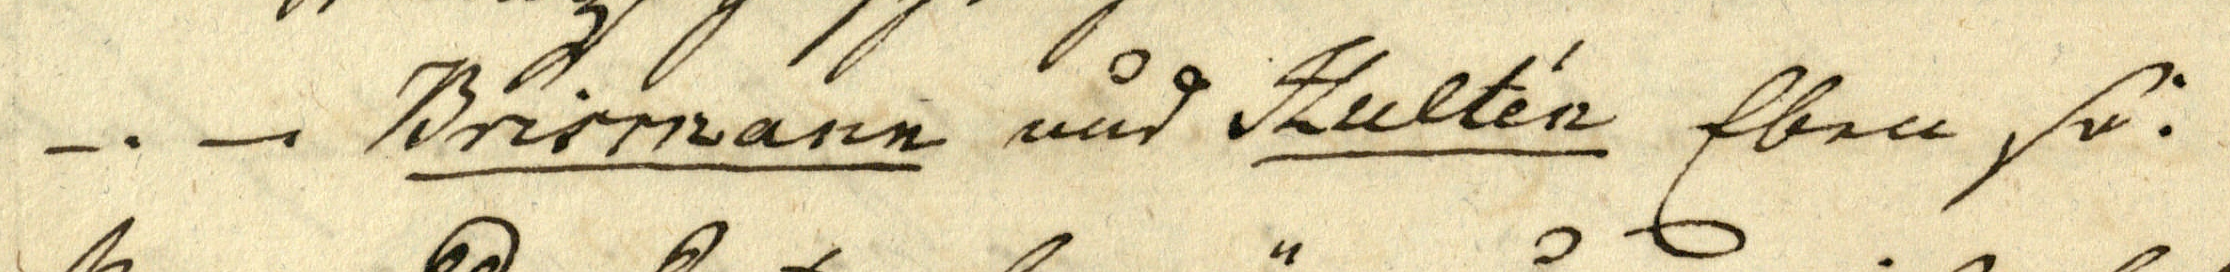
Brismann und Hultén Eben so.
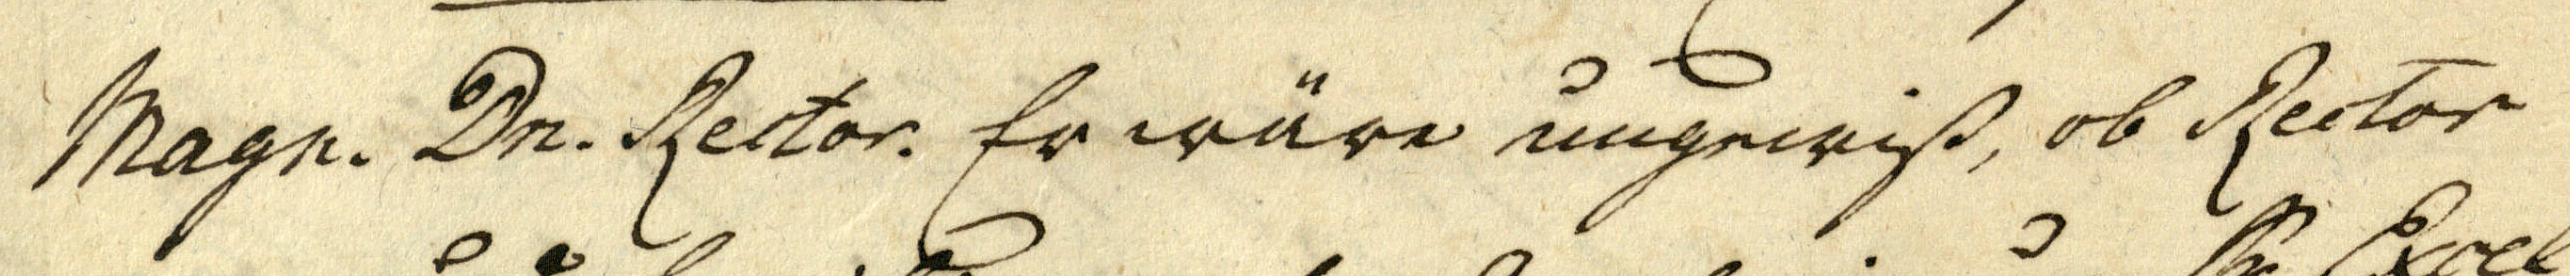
Magn. Dn. Rector. Er wäre ungewiß, ob Rector
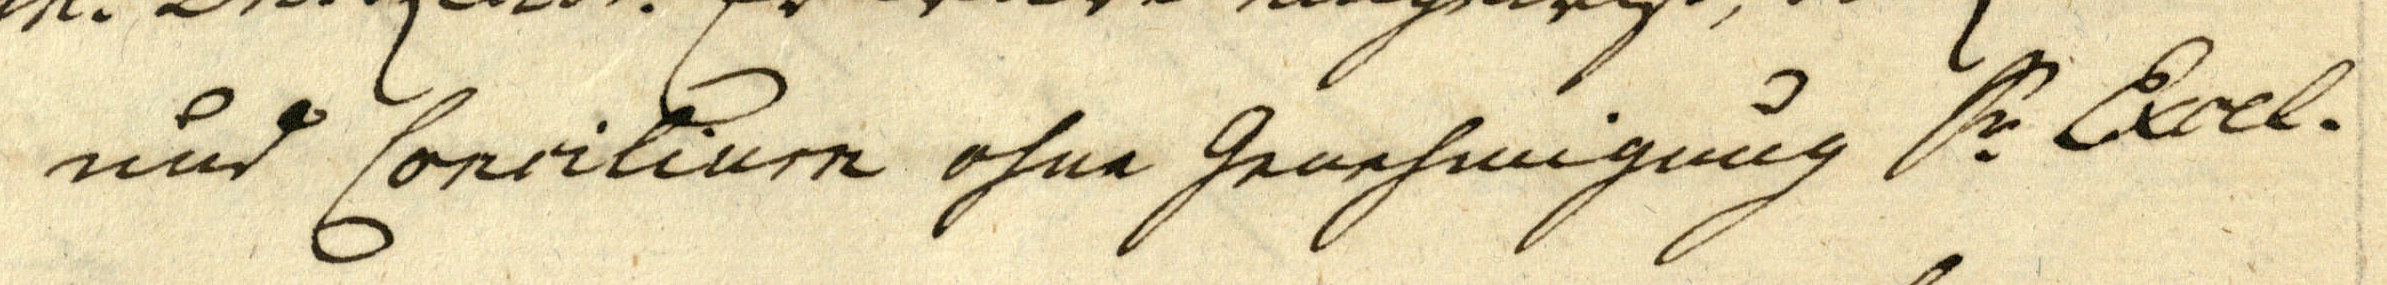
und Concilium ohne Genehmigung Sr Excel¬
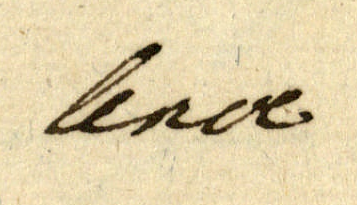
lence
